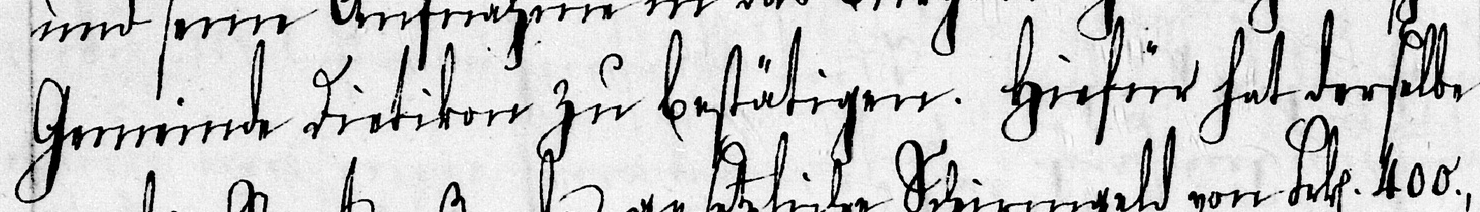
Gemeinde Dietikon zu bestätigen. Hiefür hat derselbe
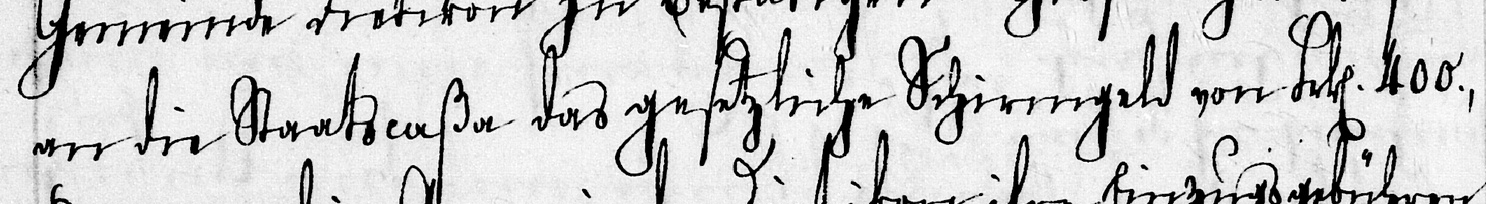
an die Staatscaßa das gesetzliche Schirmgeld von Frk[en].
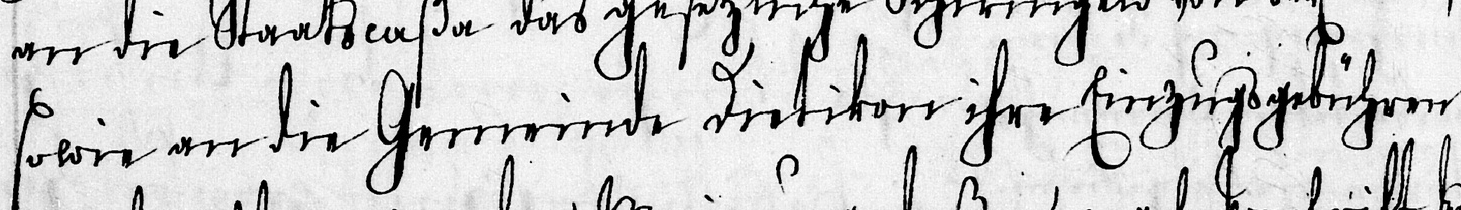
sowie an die Gemeinde Dietikon ihre Einzugsgebühren
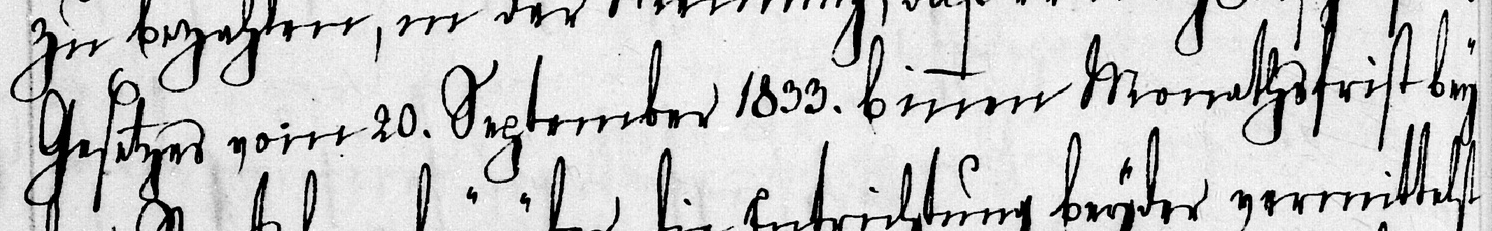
Gesetzes vom 20. September 1833. binnen Monathsfrist bey
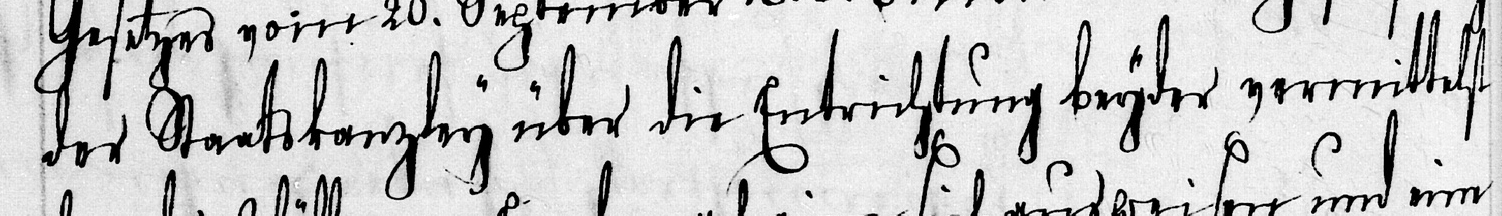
der Staatskanzley über die Entrichtung beyder vermitte¬
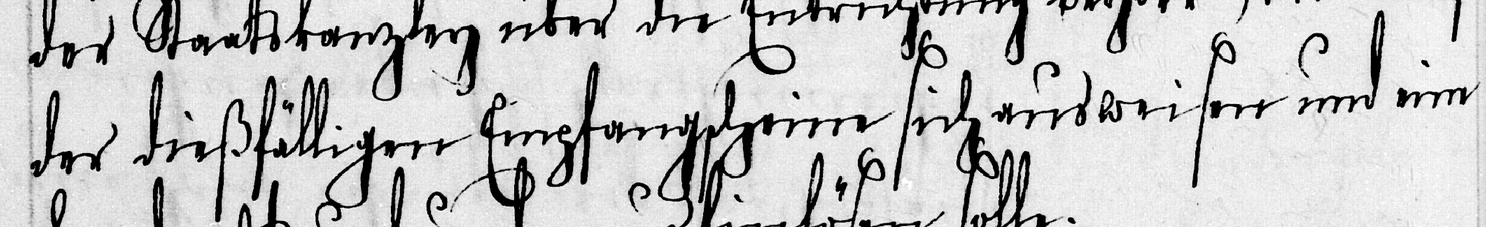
der dießfälligen Empfangscheine sich ausweisen und eine
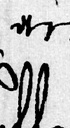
lst
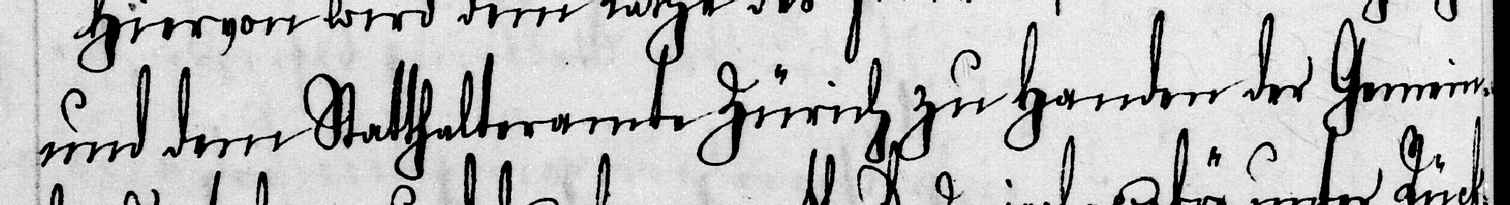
und dem Statthalteramte Zürich zu Handen der Gemein¬
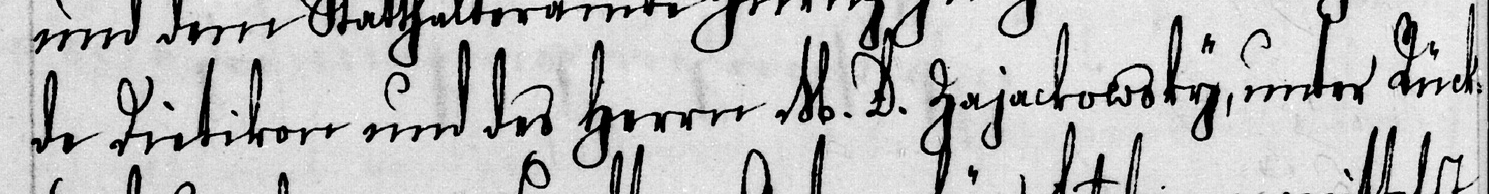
de Dietikon und des Herrn M. D. Zajackowsky, unter Rüc¬
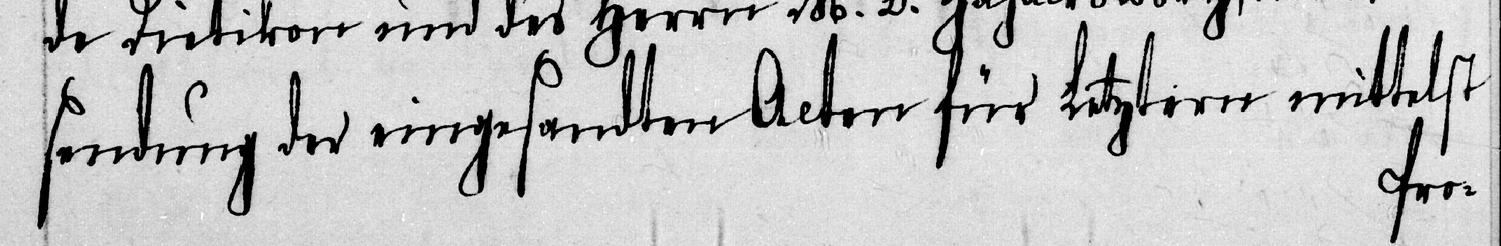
ksendung der eingesandten Acten für Letztern mittelst
